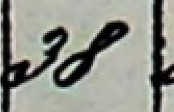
38
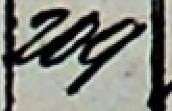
209
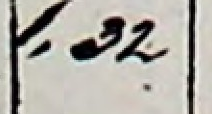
1,32
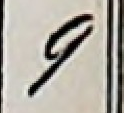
9
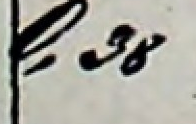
0,38
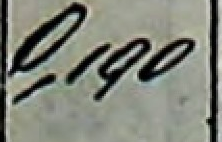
0,190
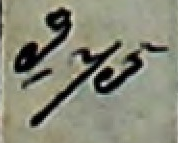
3,75
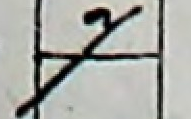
7
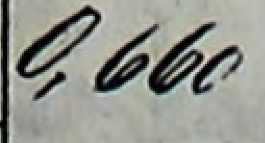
0,660
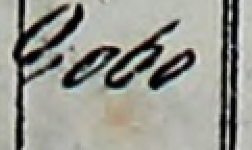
0,060
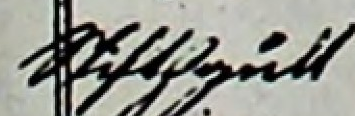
Stiftsgült
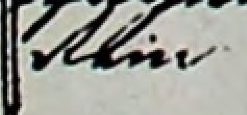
Rein
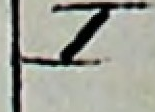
I
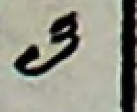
3
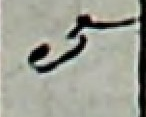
5
